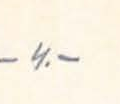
4.
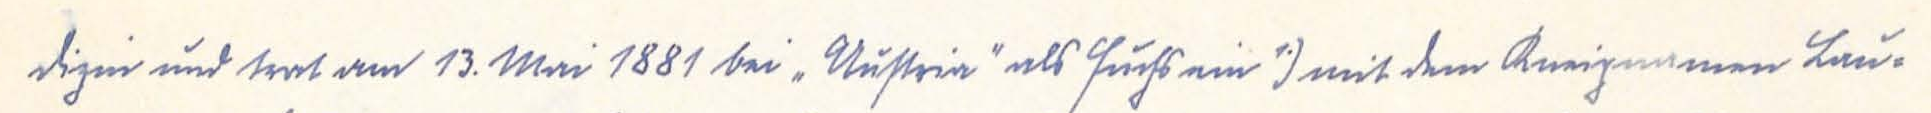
dizin und trat am 13. Mai 1881 bei "Austria" als Fuchs ein 1.) mit dem Kneipnamen Lau-
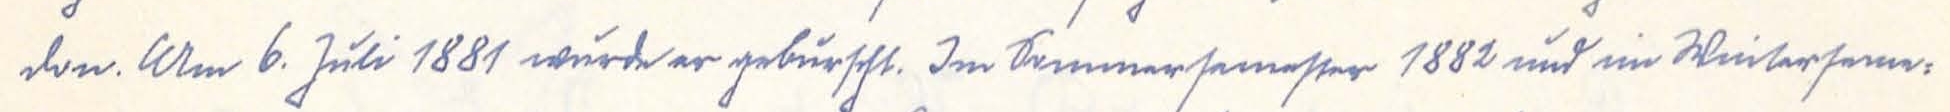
don. Am 6. Juli 1881 wurde er geburscht. Im Sommersemester 1882 und im Winterseme-
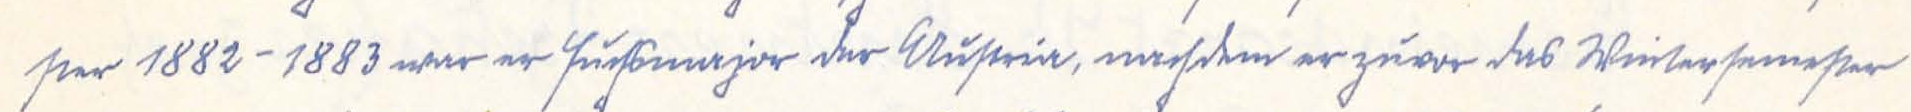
ster 1882-1883 war er Fuchsmajor der Austria, nachdem er zuvor das Wintersemester
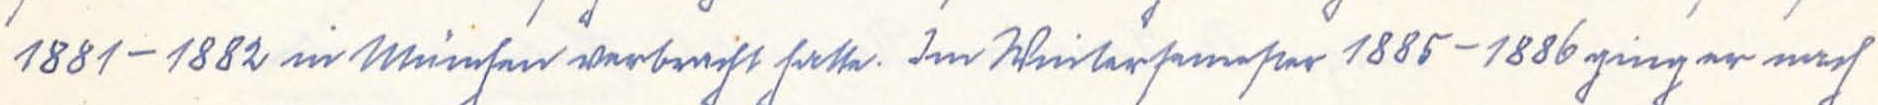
1881-1882 in München verbracht hatte. Im Wintersemester 1885-1886 ging er nach
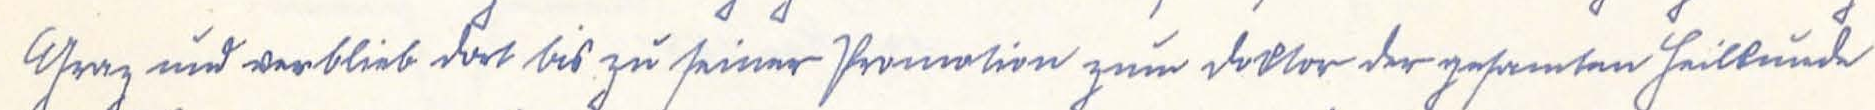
Graz und verblieb dort bis zu seiner Promotion zum Doktor der gesamten Heilkunde
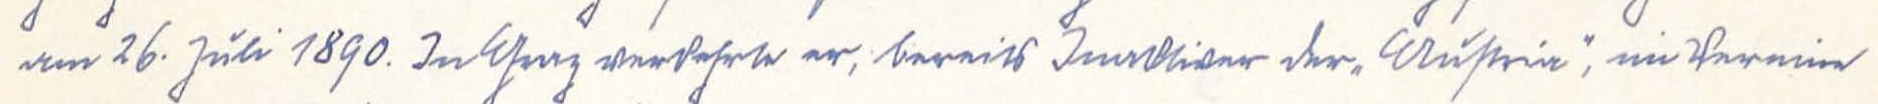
am 26. Juli 1890. In Graz verkehrte er, bereits Inaktiver der "Austria", im Verein
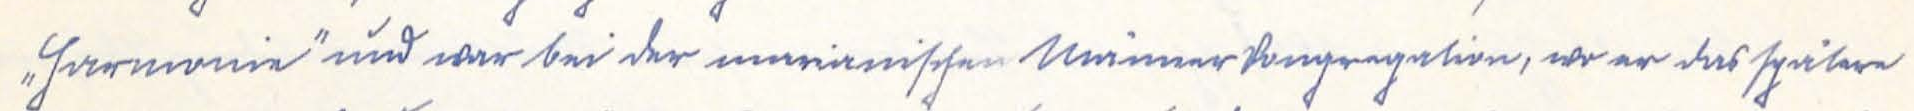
"Harmonia" und war bei der marianischen Männerkongregation, wo er das spätere
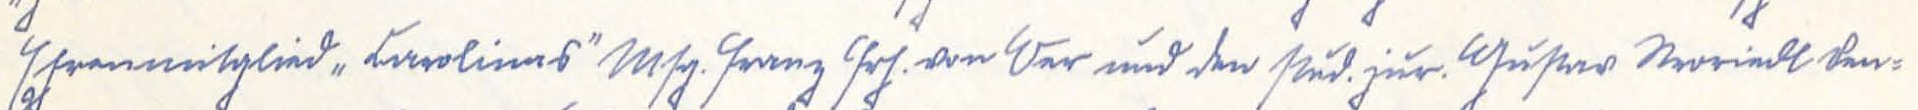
Ehrenmitglied "Carolinas" Msg. Franz Frh. von Oer und den stud. jur. Gustav Stroriedl ken-
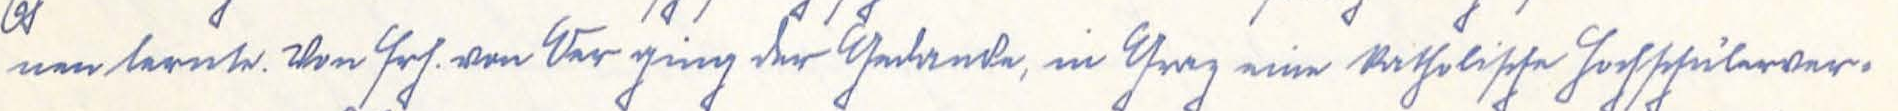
nen lernte. Von Frh. von Oer ging der Gedanke, in Graz eine katholische Hochschülerver-
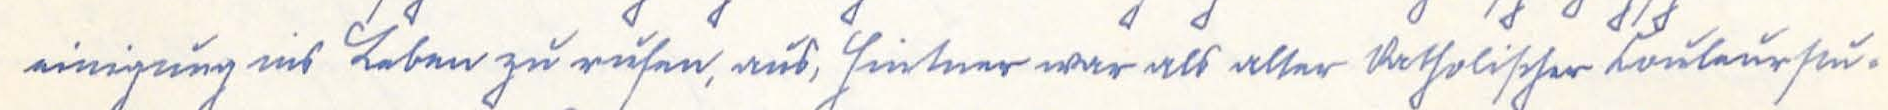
einigung ins Leben zu rufen aus, Hintner war als alter katholischer Couleurstu-
